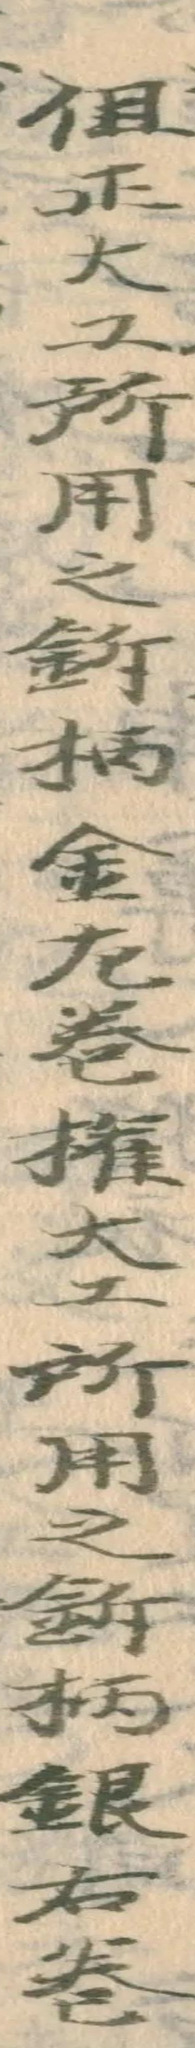但正大工所用之釿柄金左巻権大工所用之釿柄銀右巻
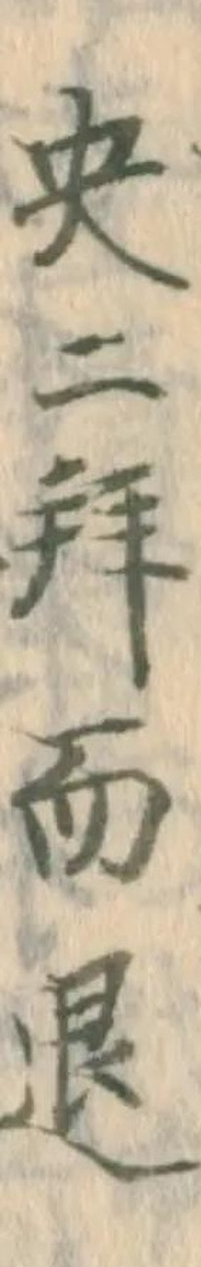央二拝而退
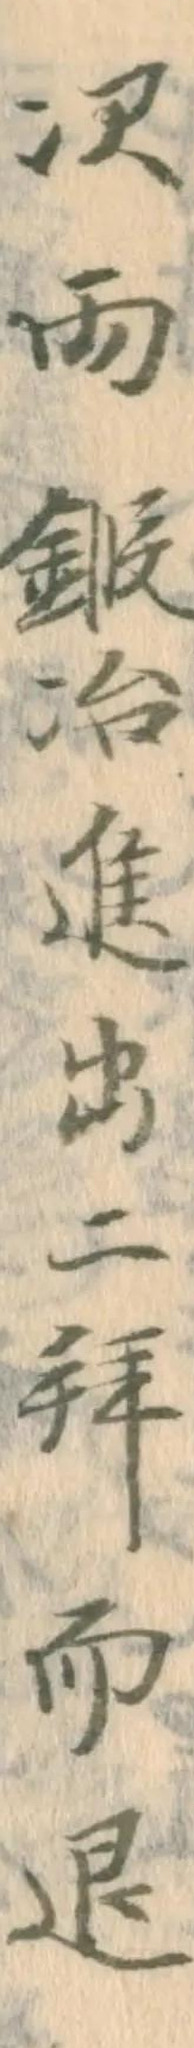次両鍛冶進出二拝而退
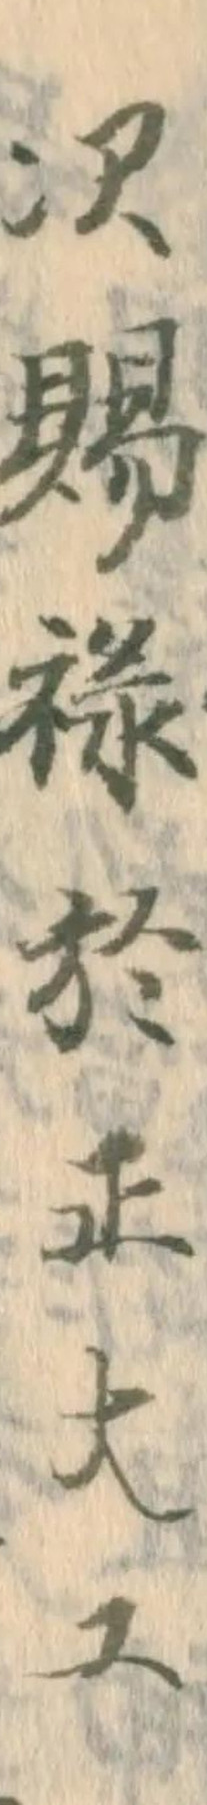次賜禄於正大工
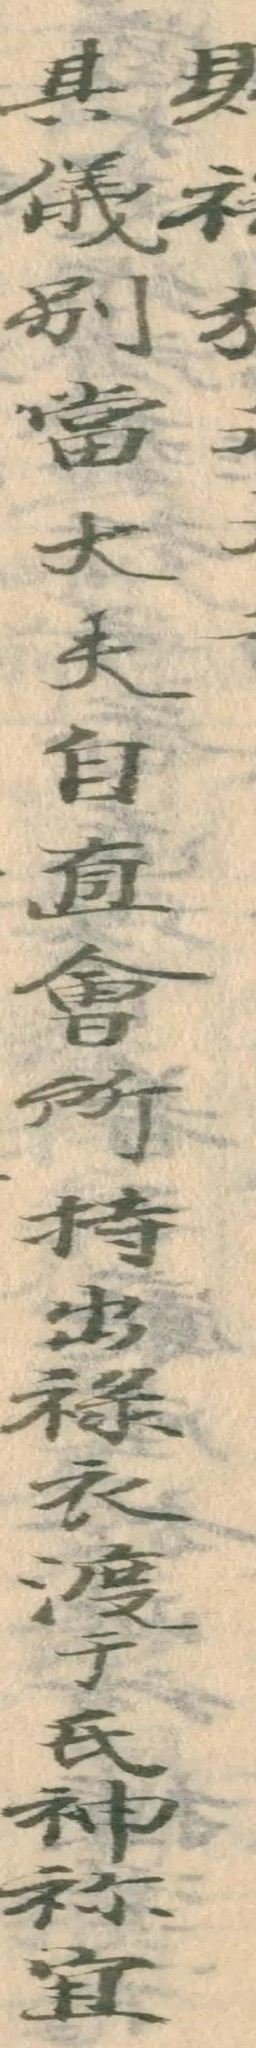其儀別当大夫自直会所持出禄衣渡于氏神祢宜
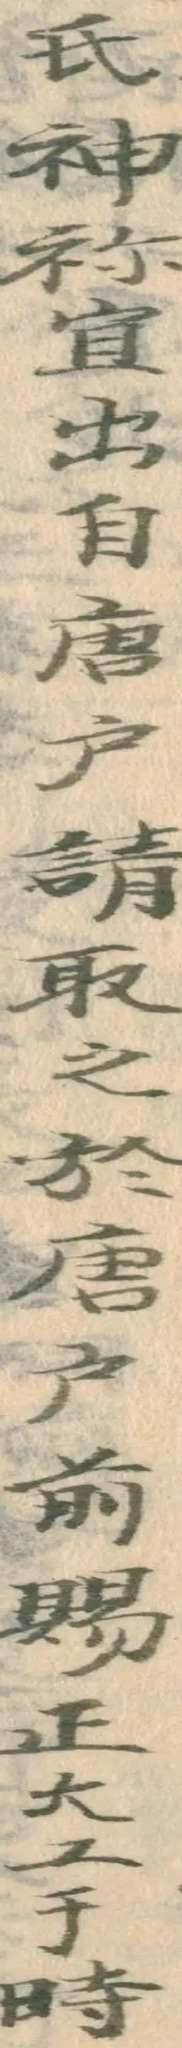氏神祢宜出自唐戸請取之於唐戸前賜正大工于時
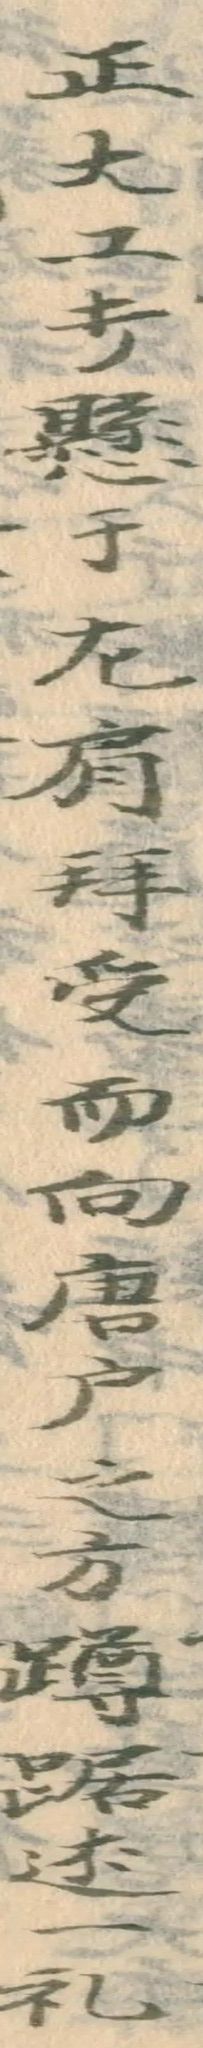正大工打懸于左肩拝受而向唐戸之方蹲踞述一礼
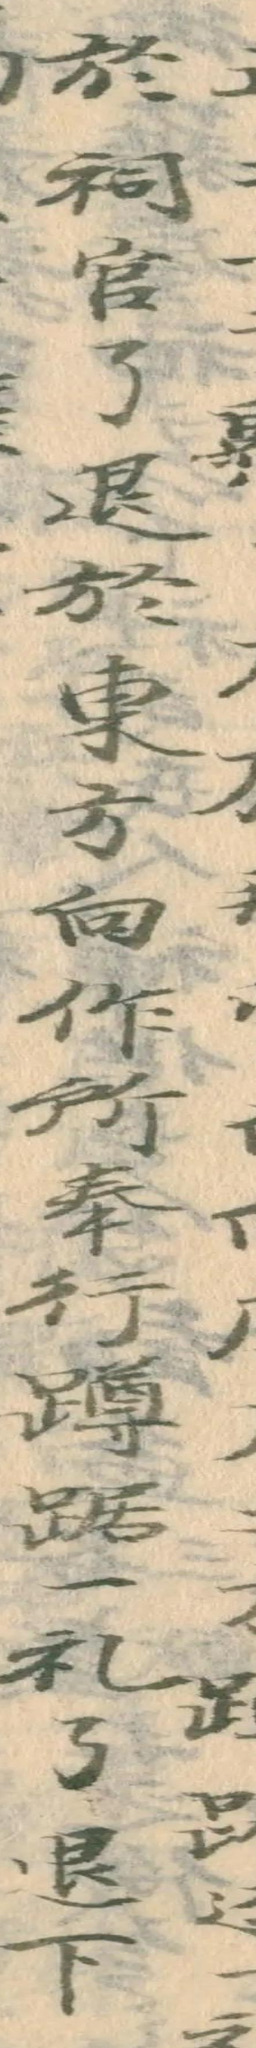於祠官了退於東方向作所奉行蹲踞一礼了退下
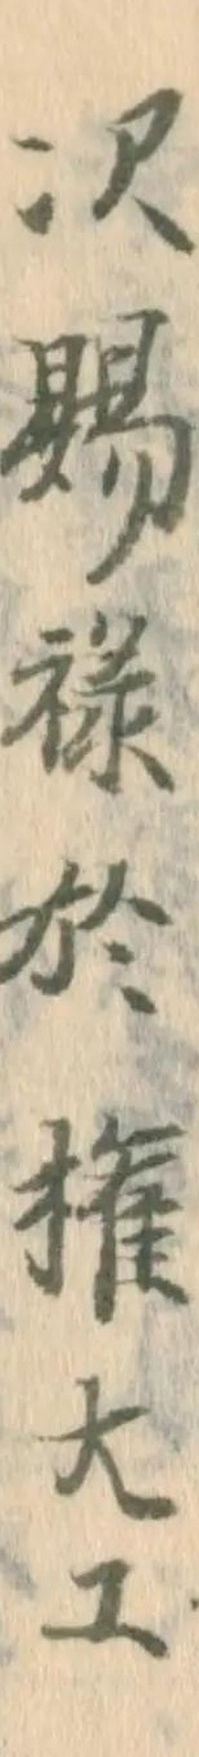次賜禄於権大工
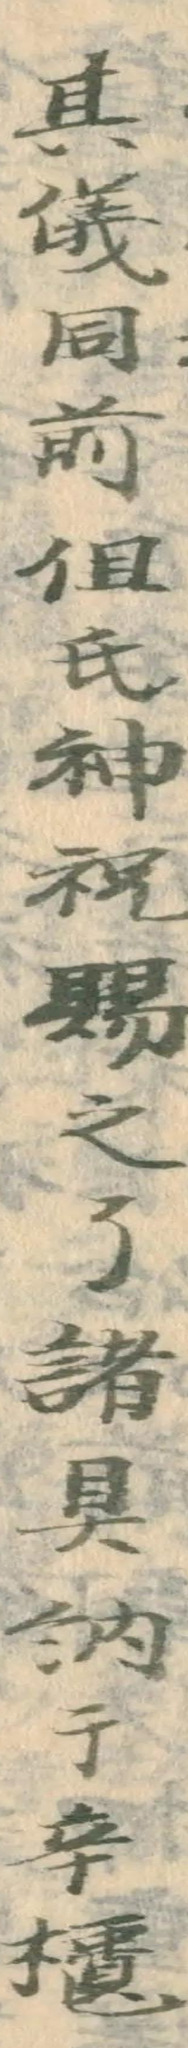其儀同前但氏神祝賜之了諸具納于辛櫃
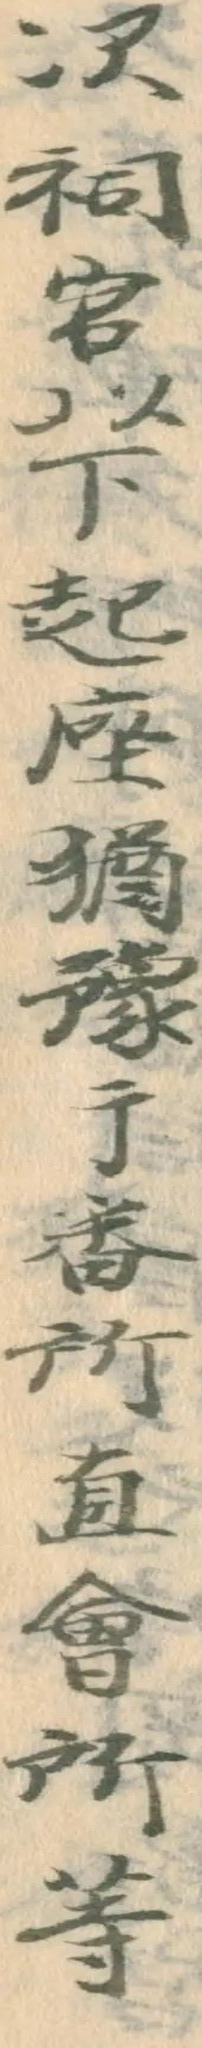次祠官以下起座猶予于番所直会所等

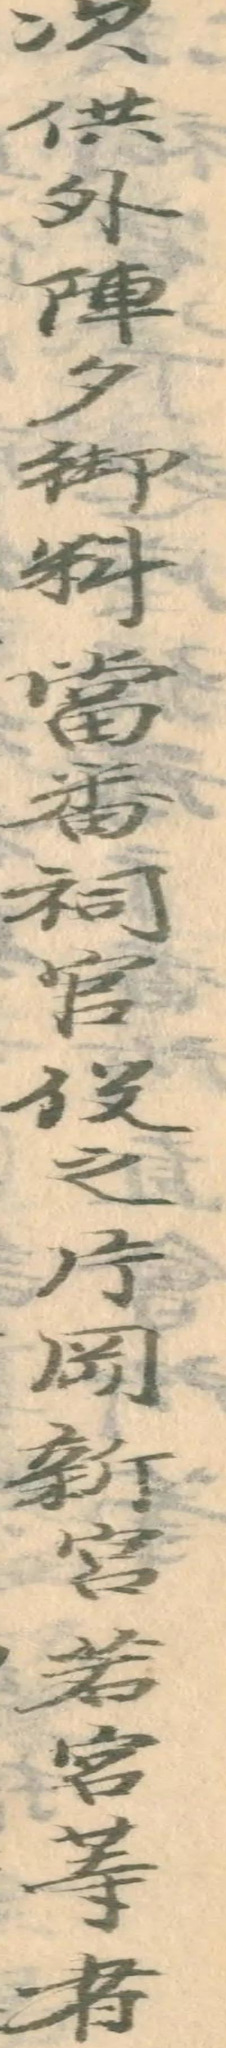次供外陣夕御料当番祠官役之片岡新宮若宮等は
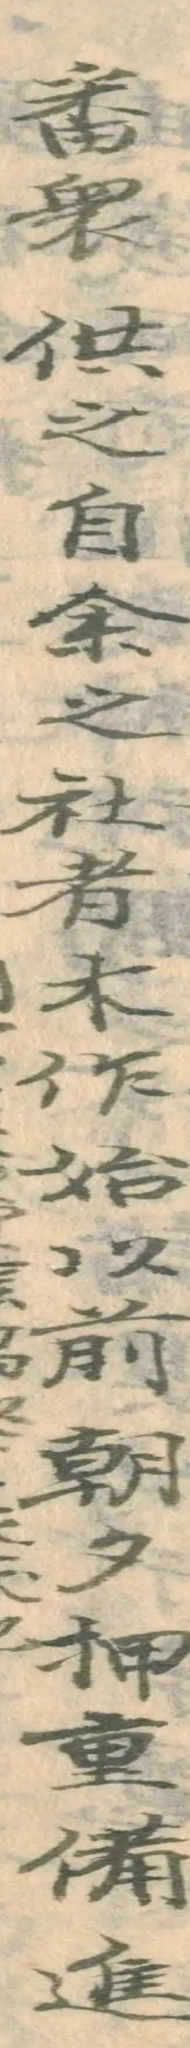番衆供之自余之社は木作始以前朝夕押重備進
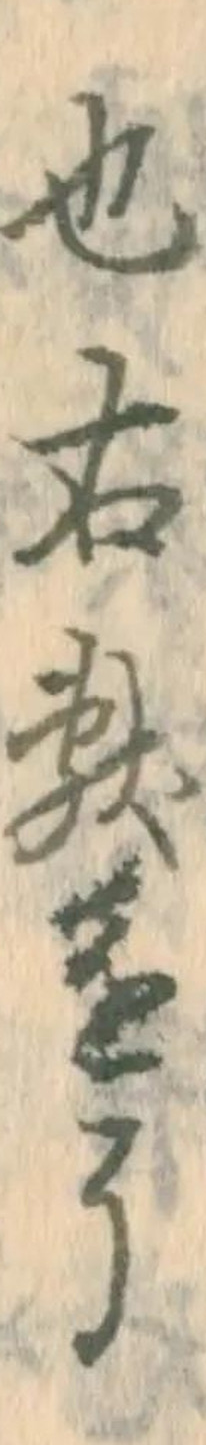也右献進了
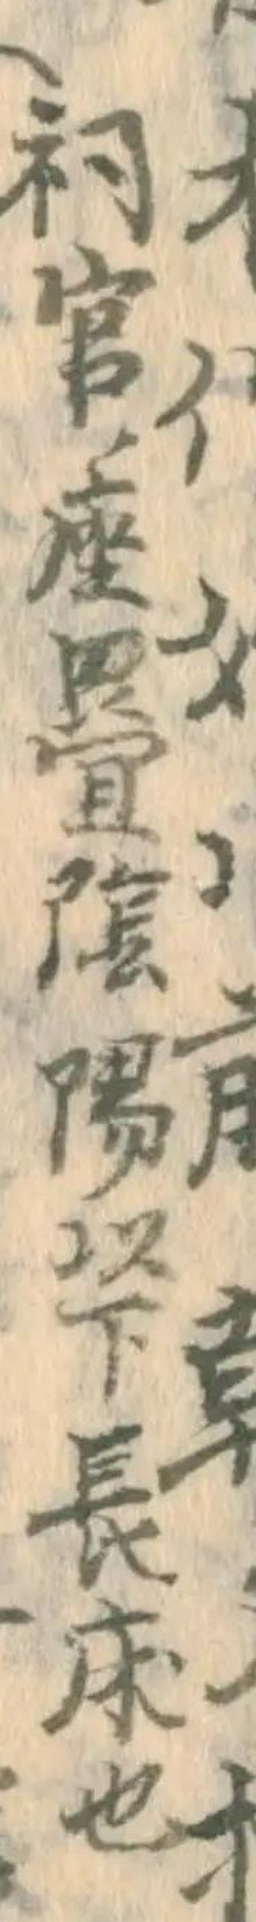(祠官ノ座畳陰陽以下長床也
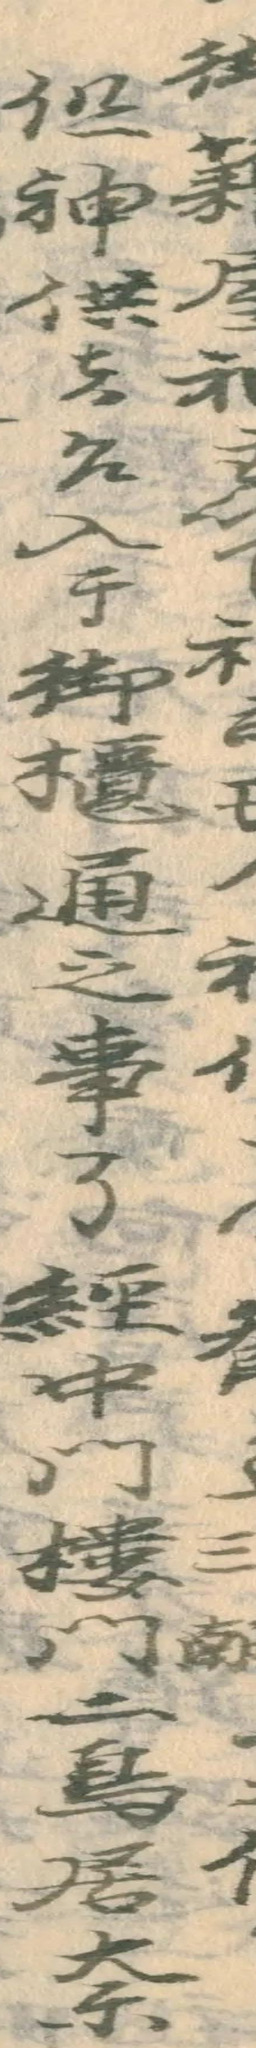但神供は乍入于御櫃通之事了経中門楼門二鳥居奈
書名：賀茂社記録. 第17冊
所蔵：国立国会図書館 National Diet Library, JAPAN
